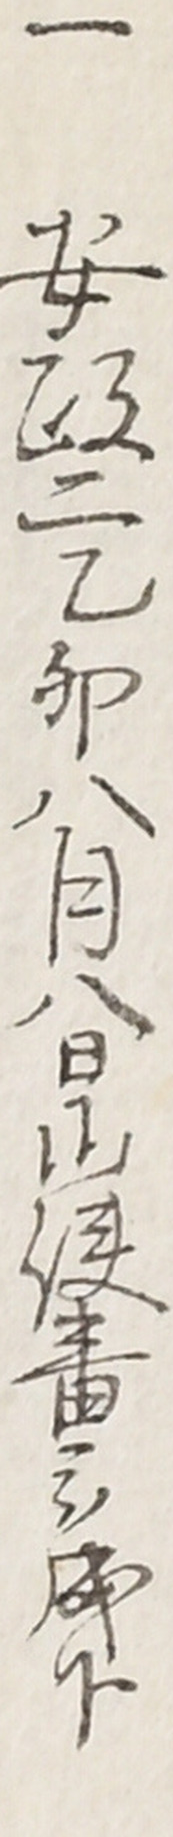一安政二乙卯八月八日御使番被成下
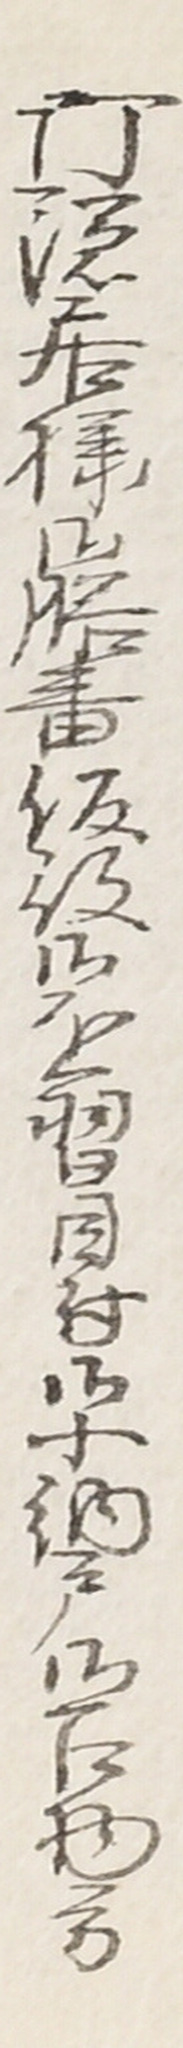御隠居様御膳番仮役御近習目付御小納戸御召物方
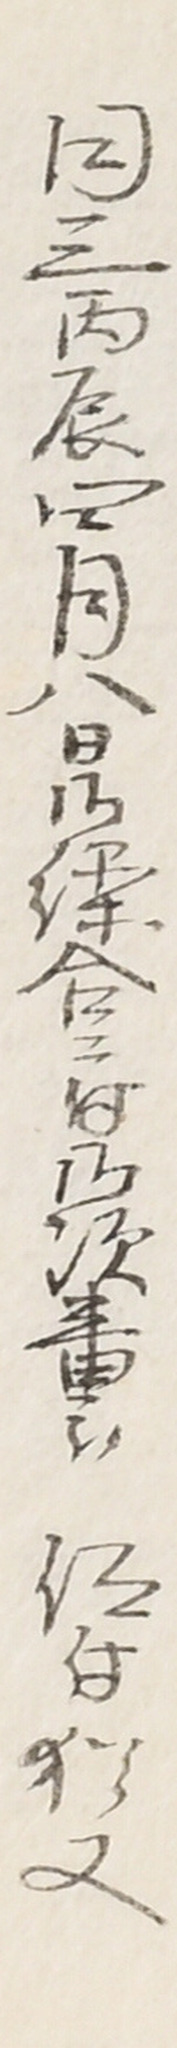一同三丙辰四月八日御繰合ニ付御次番被仰付猶又
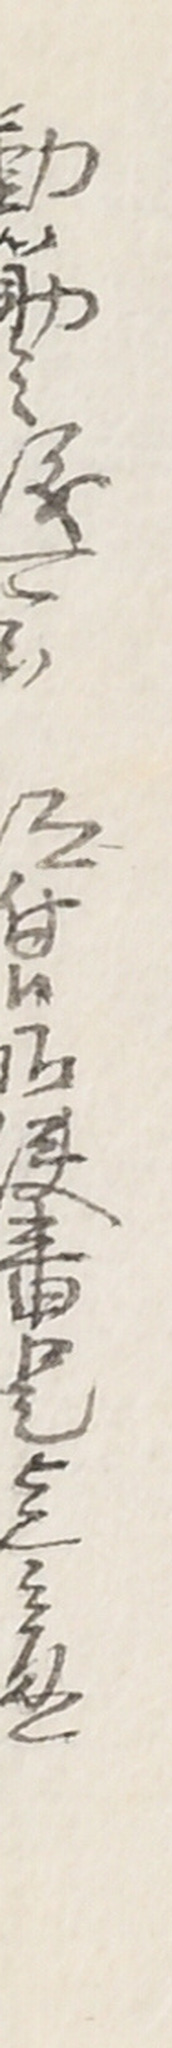勤筋之儀可被仰付候御使番是迄之通
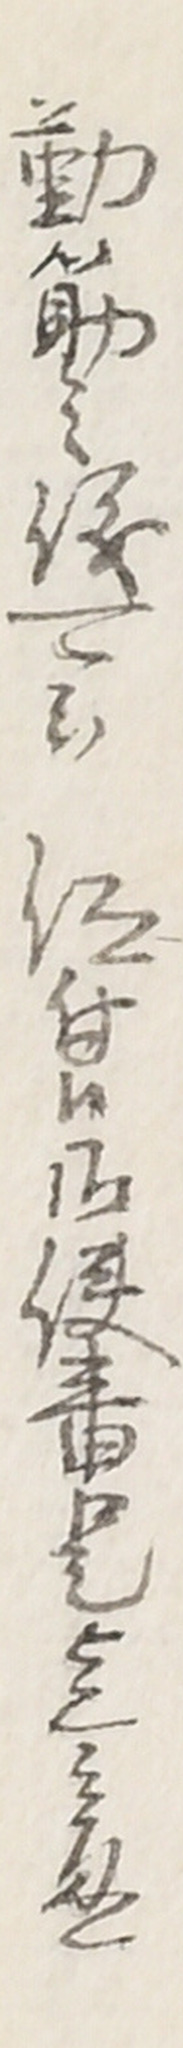勤筋之儀可被仰付候御使番是迄之通
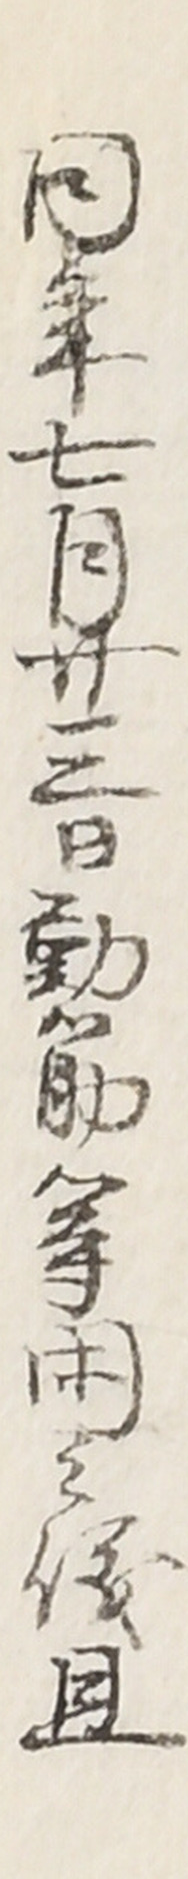一同年七月廿三日勤筋等閑之儀且
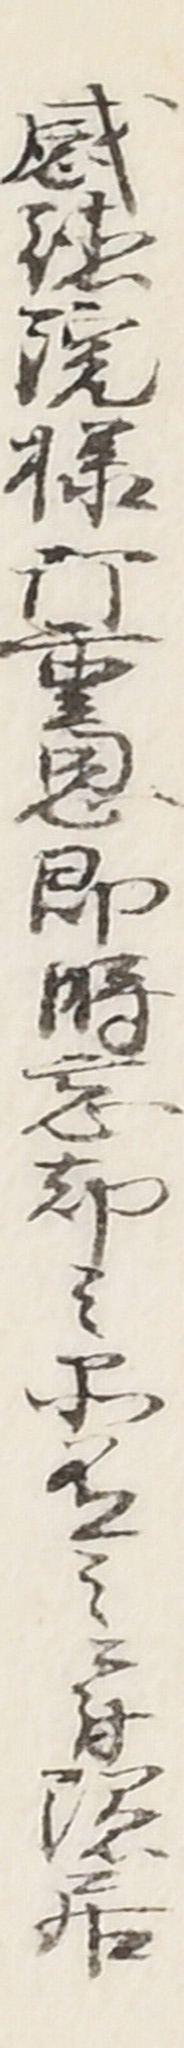感徳院様御重恩即時忘却之品有之ニ付隠居
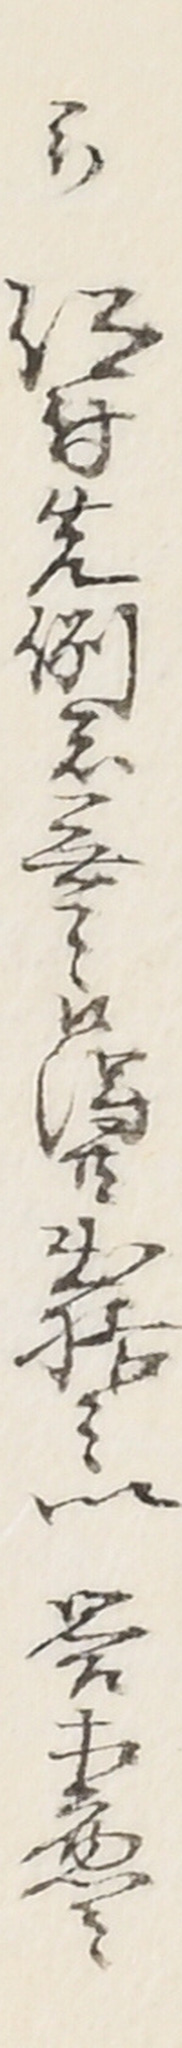被仰付先例は無之候得共出格之以思召相応之
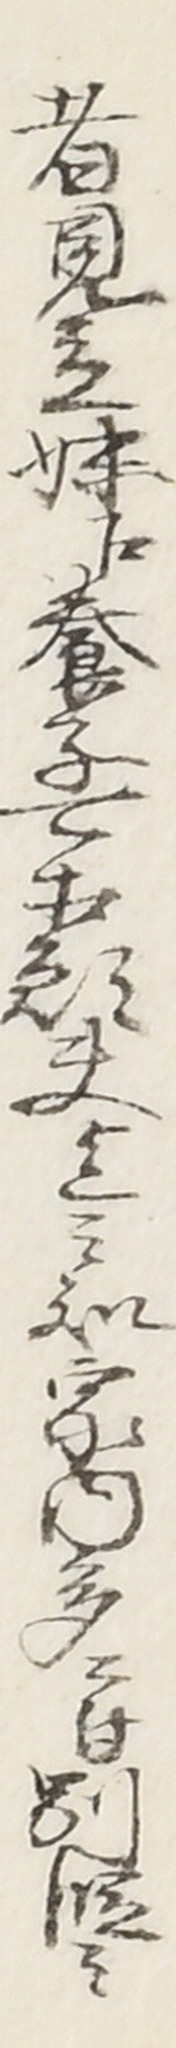者見立妹江養子可相願夫迄之処家内多ニ付別段之
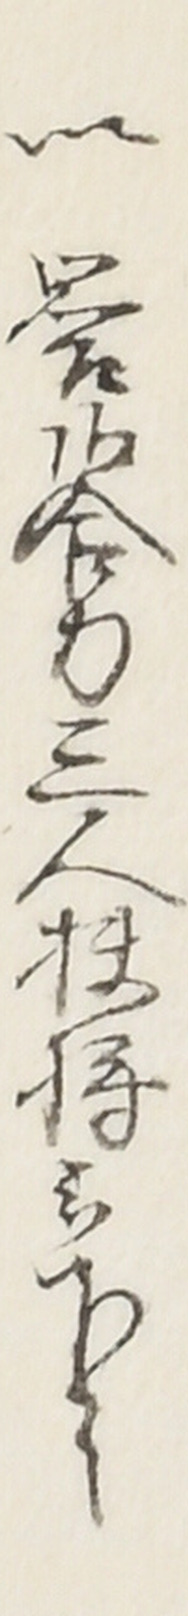以思召御合力三人扶持被下之
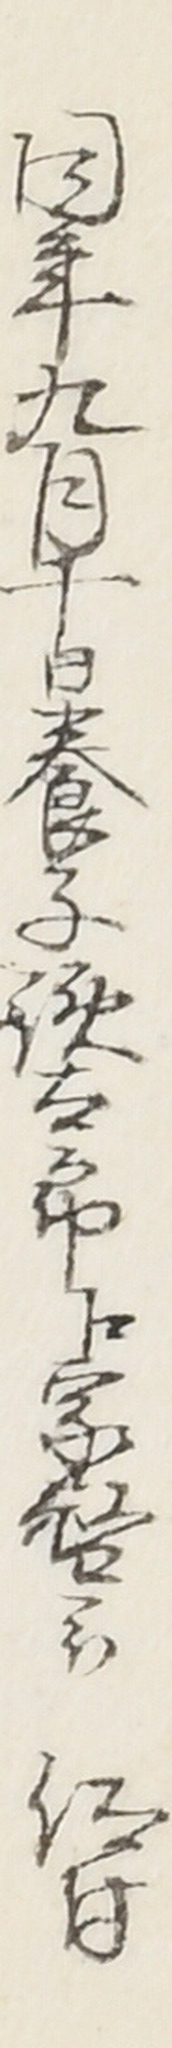一同年九月十日養子鉄太郎江家督被仰付
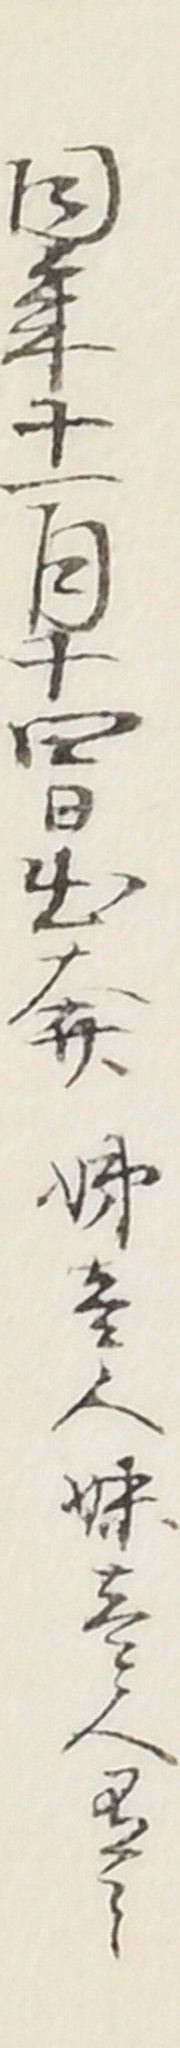一同年十一月十四日出奔姉壱人妹壱人有之
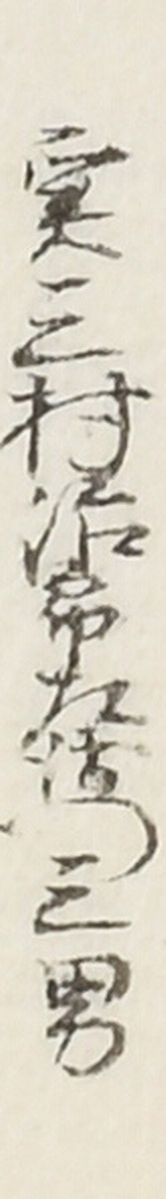実三村治郎左衛門三男
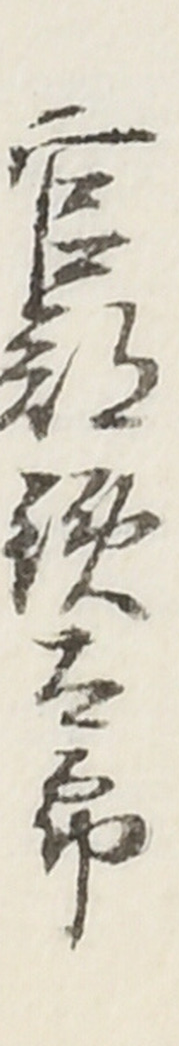宮部鉄太郎

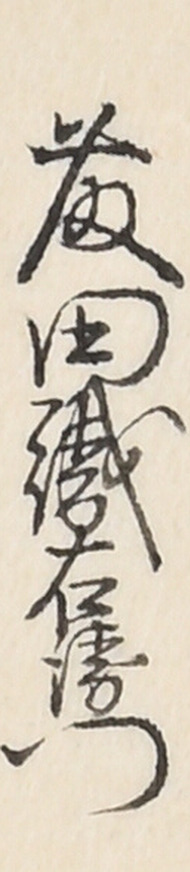藤田織右衛門
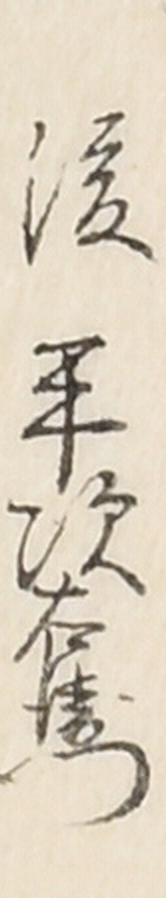後平次右衛門
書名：給人諸士勤仕録（七）
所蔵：伊那市立高遠町図書館・合同会社AMANE
